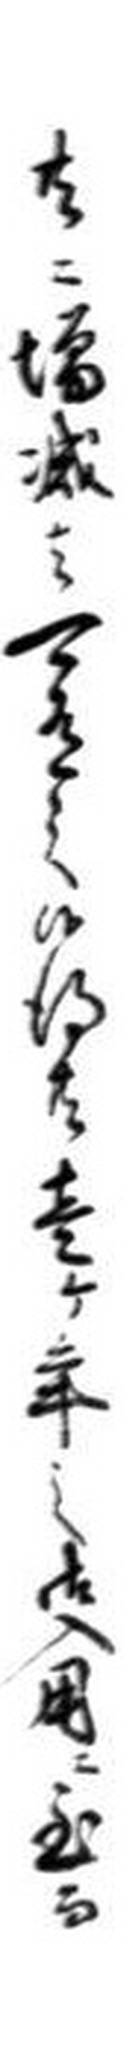共ニ増減者可有之候得共壱ヶ年之御入用ニ至而
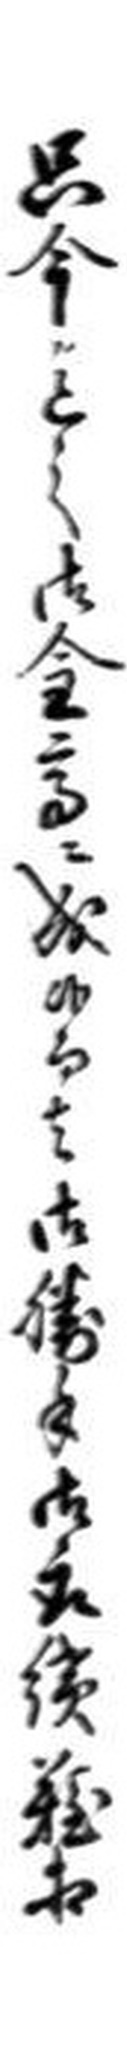只今迄之御金高ニ成候而者御勝手御取続難相
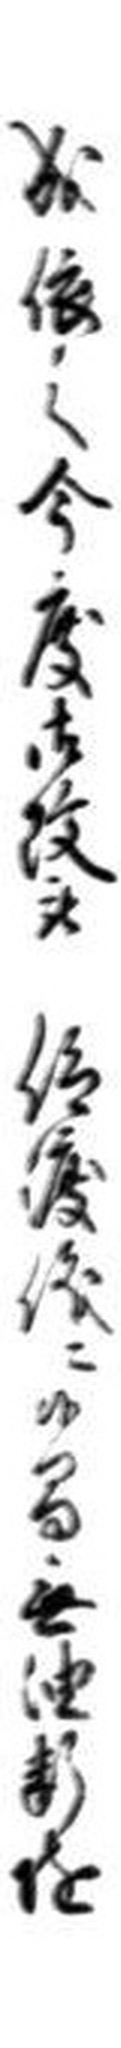成依之今度御改被仰渡儀ニ候間無油断随
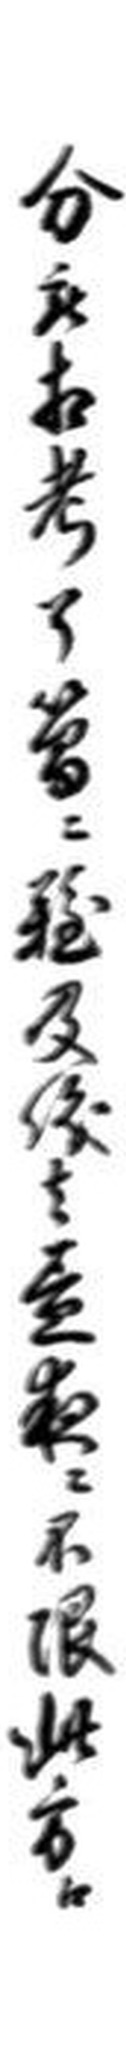分被相考了簡ニ難及儀者昼夜ニ不限此方江
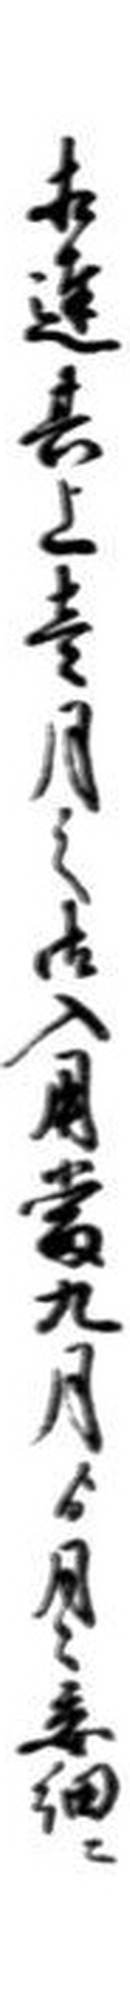相達其上壱月之御入用当九月ゟ月々委細ニ
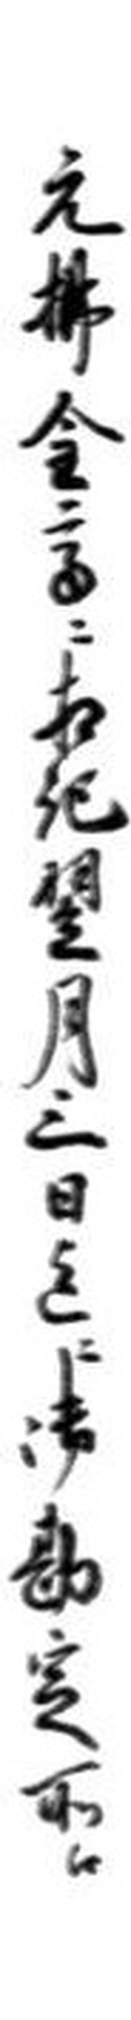元払金高ニ相記翌月三日迄ニ御勘定所江
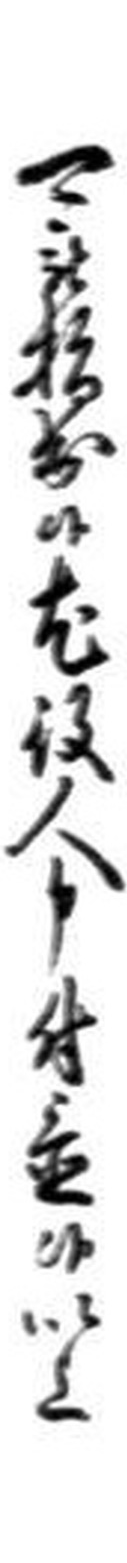可被指出候尤役人申付置候以上
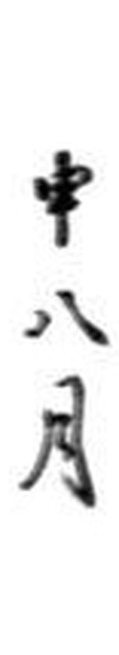申八月
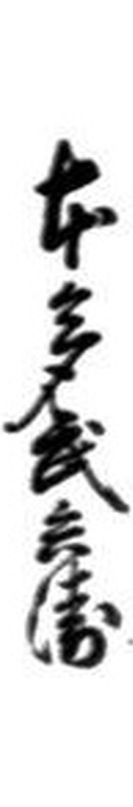本多武兵衛
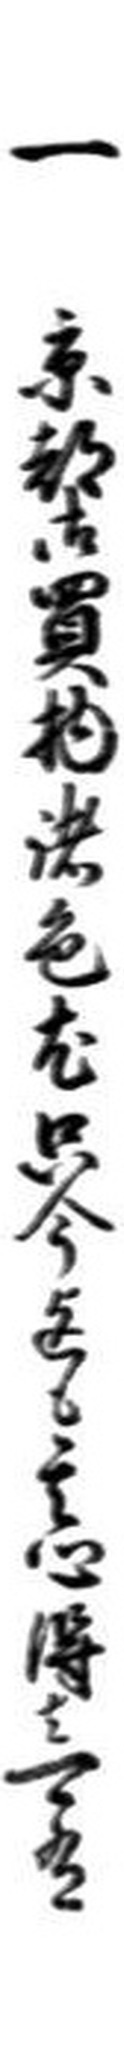一京都御買物諸色尤只今迄も其心得者可有
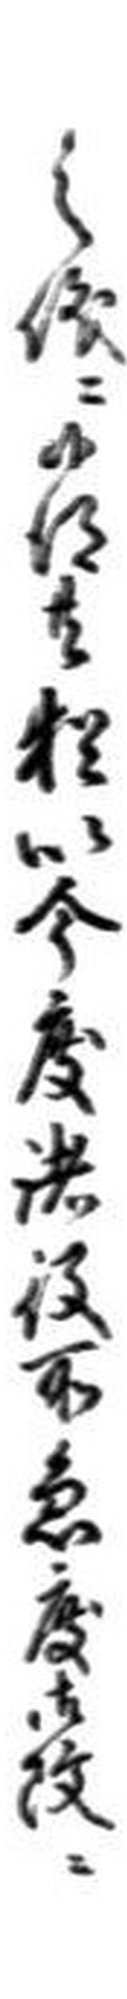之儀ニ候得共猶以今度諸役所急度御改ニ

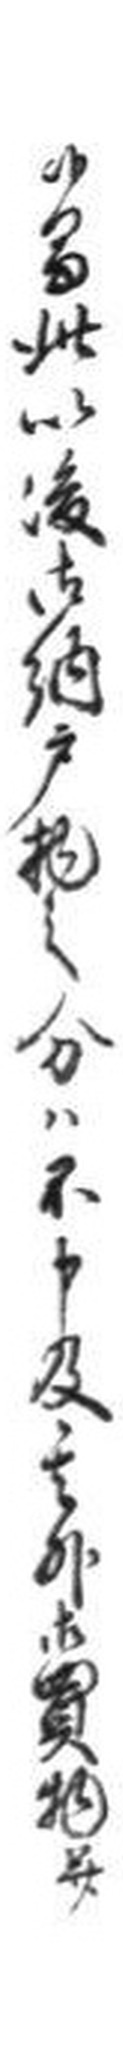候間此以後御納戸物之分ハ不申及其外御買物并
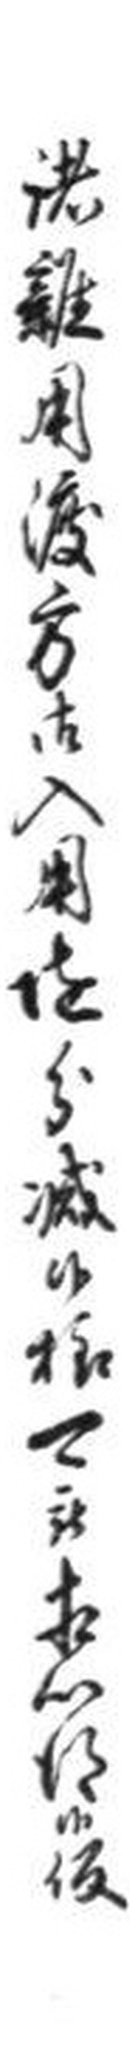諸雑用渡方御入用随分減候様可被相心得候仮
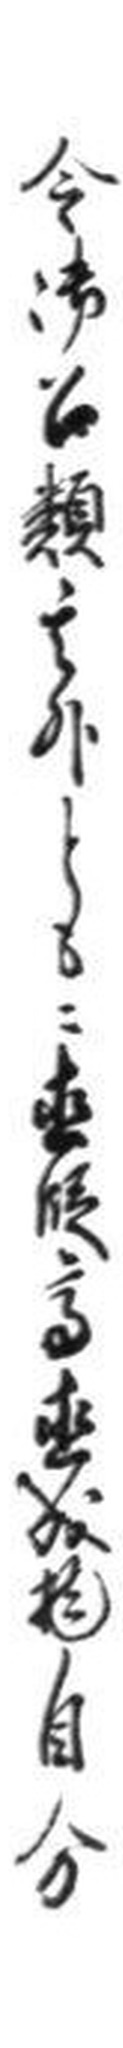令御召類其外ともニ直段高直成物自分
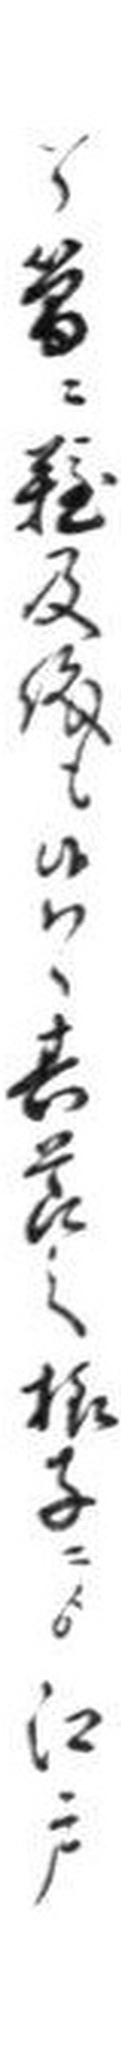了簡ニ難及儀も候ハヽ其節之様子ニゟ江戸
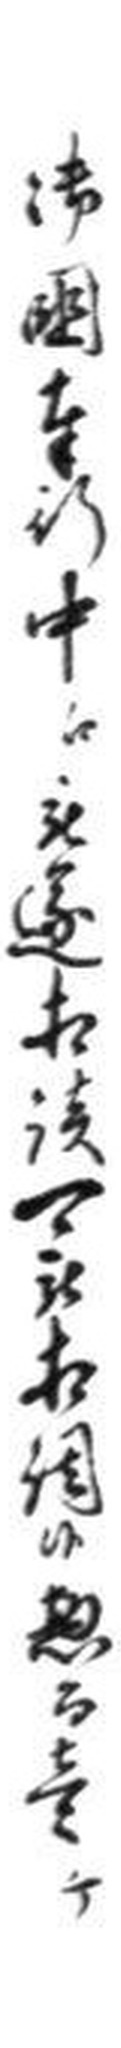御国奉行中江被遂相談可被相調候惣而壱ヶ
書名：家譜 三十一 吉邦公 享保元年
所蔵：福井県文書館 Fukui Prefectural Archives
